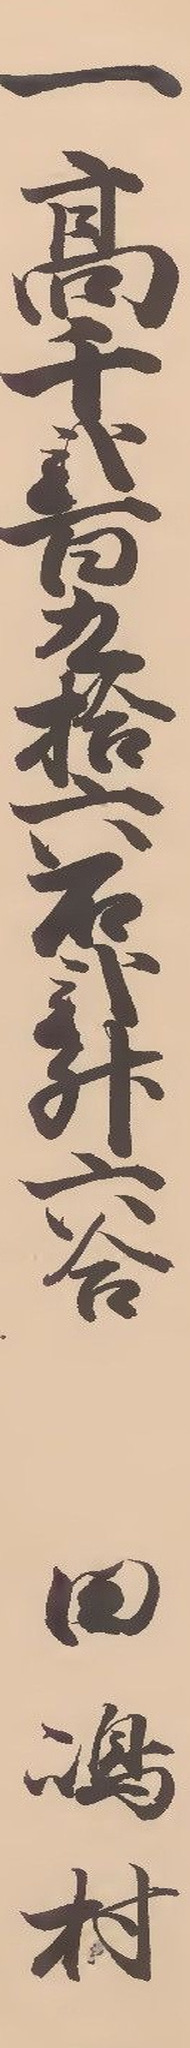一高千弐百九拾六石弐升六合田島村
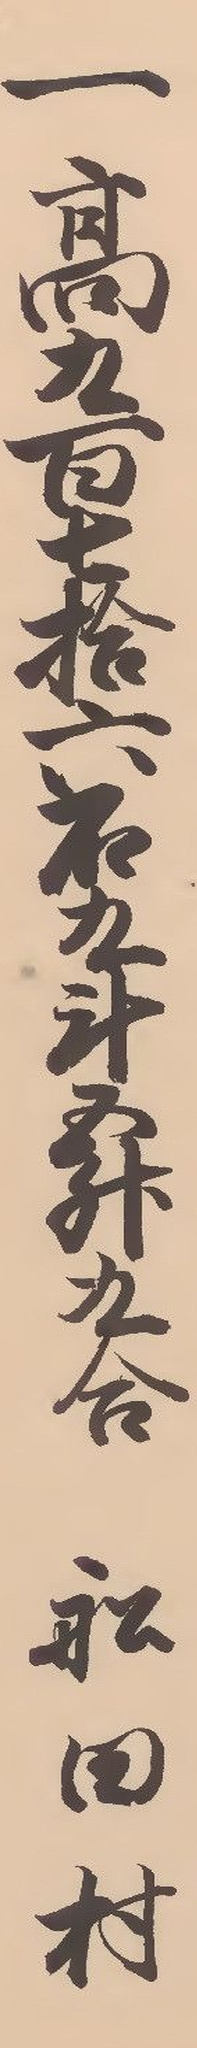一高九百七拾六こｋ九斗五升九合船田村

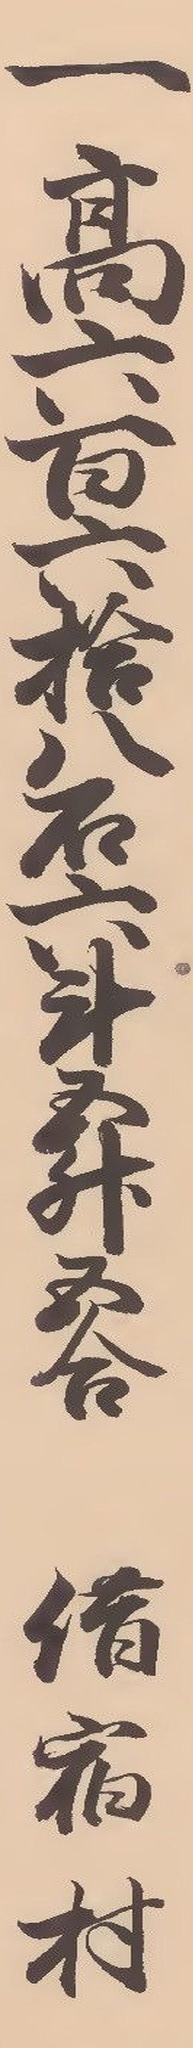一高六百六拾八石六斗五升五合借宿村
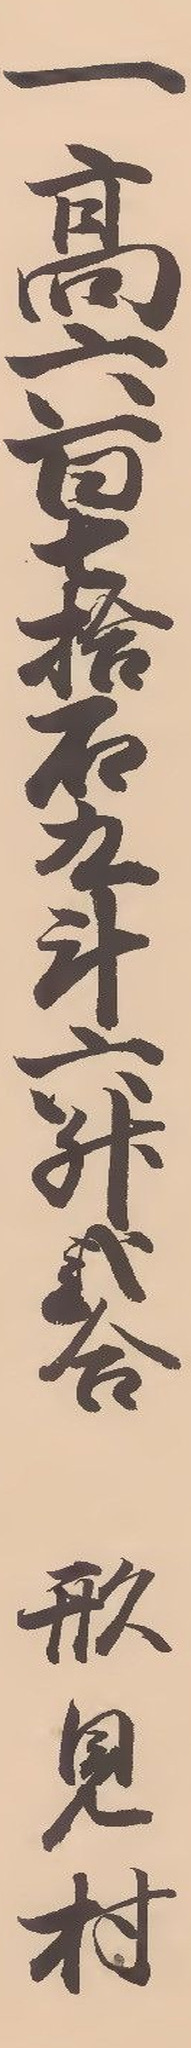一高六百七拾石九斗六升弐合形見村
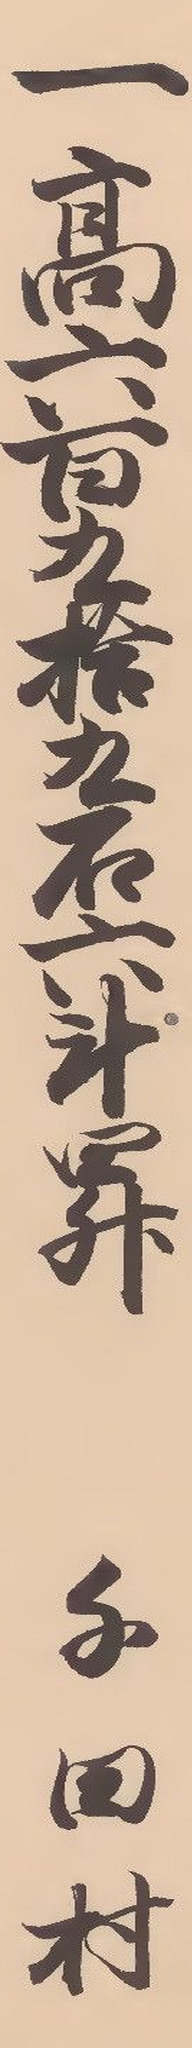一高六百九拾九石六斗四升千田村
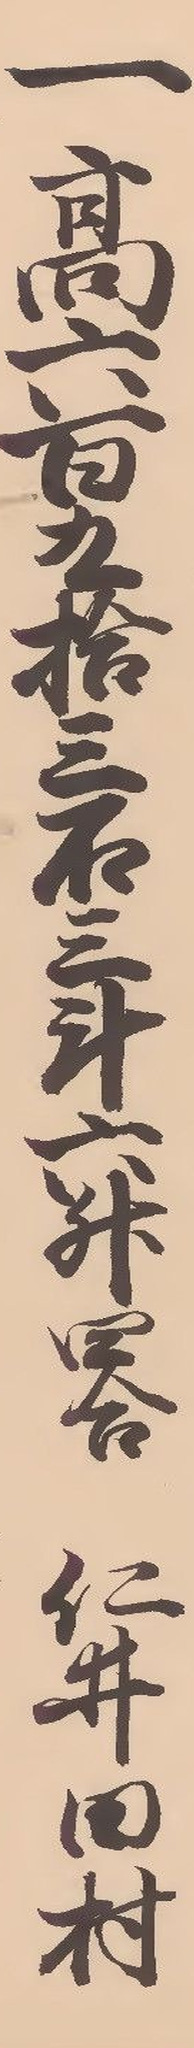一高六百九拾三石三斗六升四合仁井田村
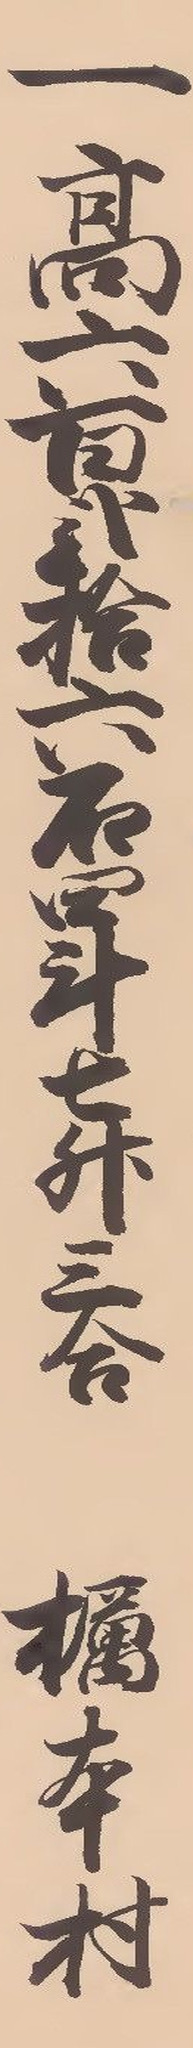一高六百弐拾六石四斗七升三合栃本村
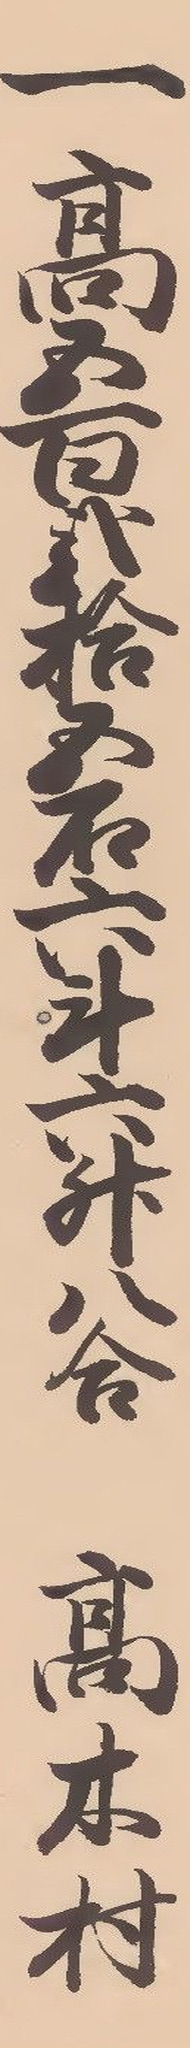一高五百弐拾五石六斗六升八合高木村
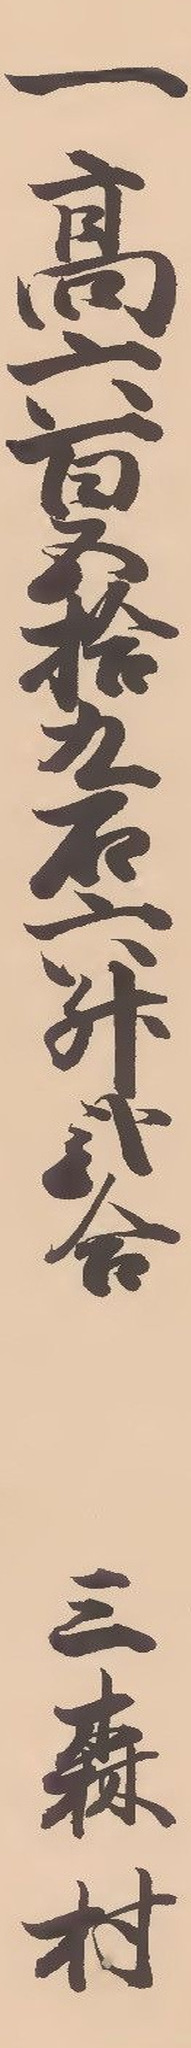一高六百五拾九石六升弐合三森村
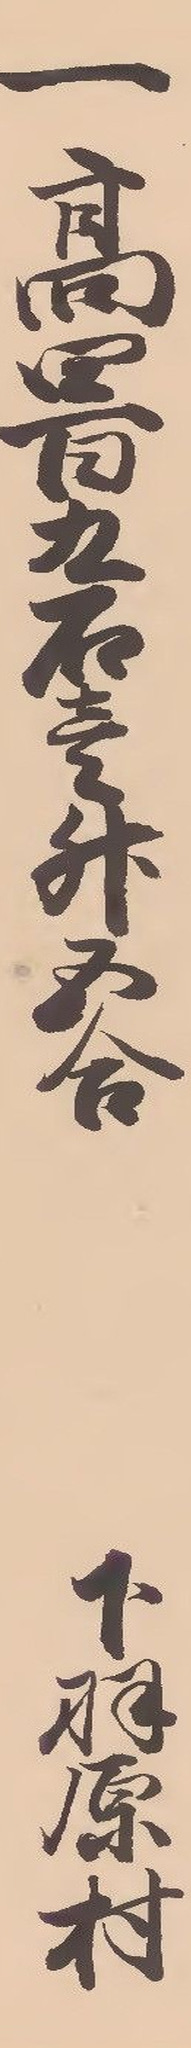一高四百九石壱升五合下羽原村

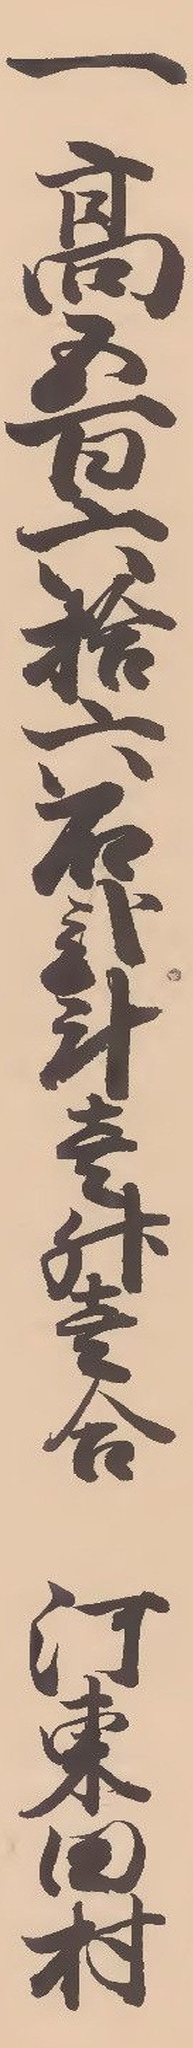一高五百六拾六石弐斗壱升壱合河東田村
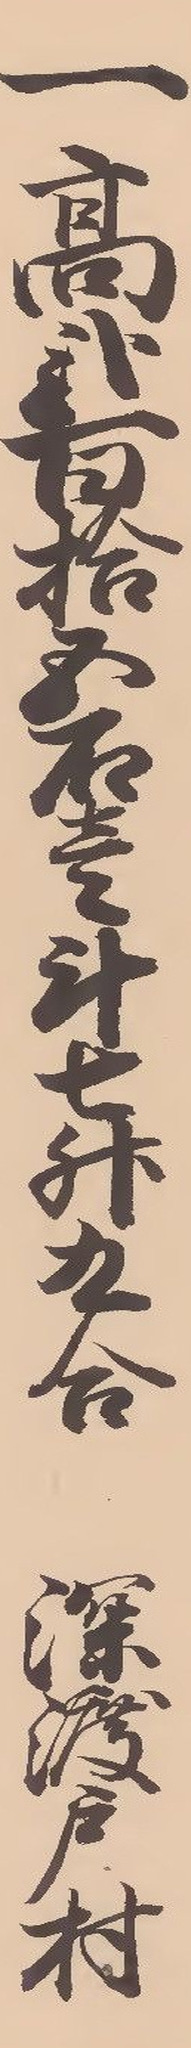一高弐百拾五石壱斗七升九合深渡戸村
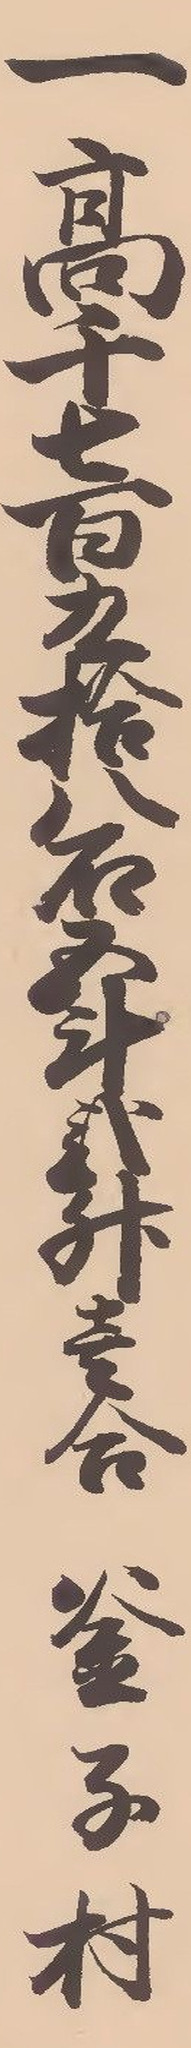一高千七百九拾八石五斗弐升壱合釜子村
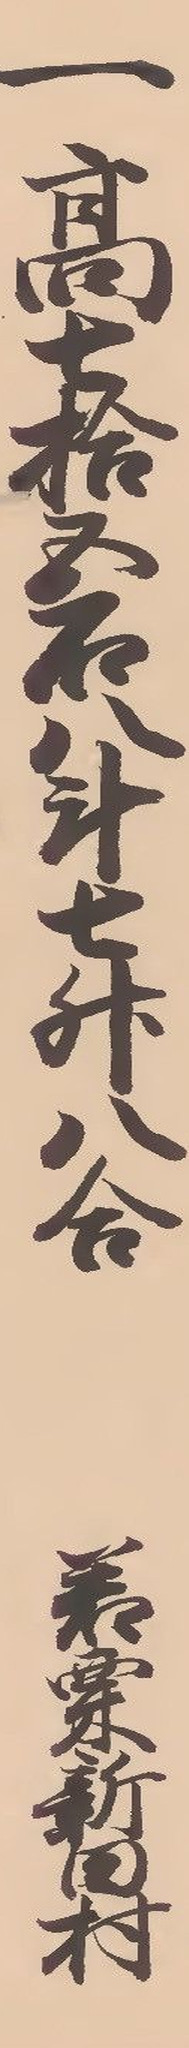一高七拾五石八斗七升八合若栗新田村
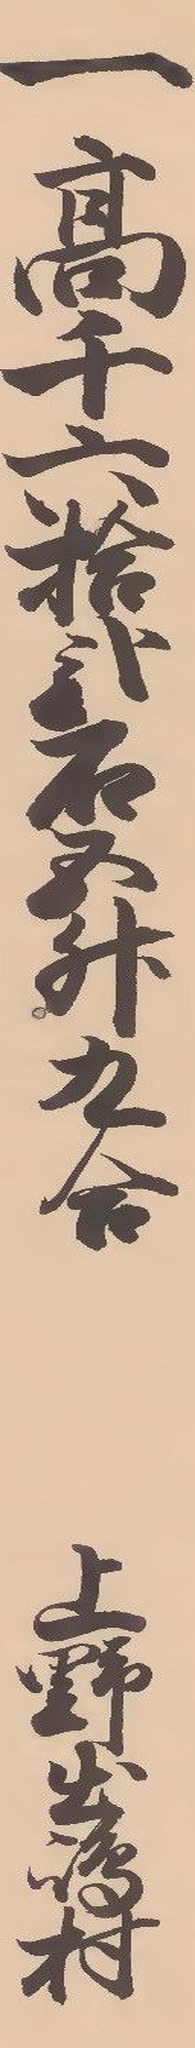一高千六拾弐石五升九合上野出島村
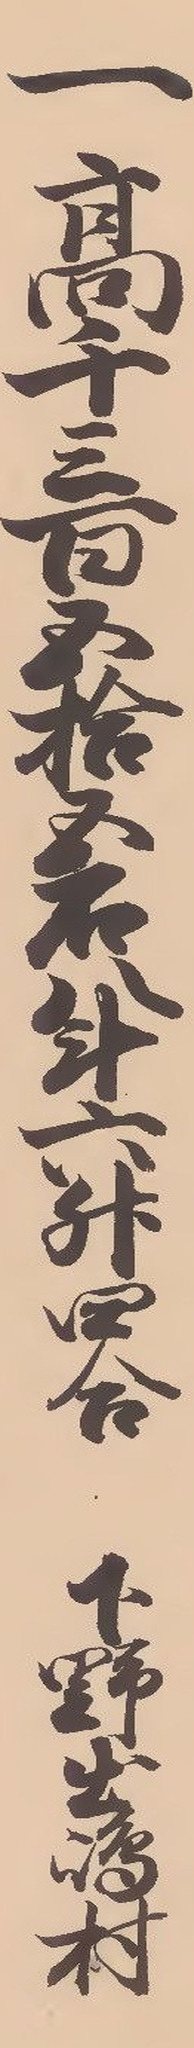一高千三百五拾五石八斗六升四合下野出島村
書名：陸奥国郷帳　２
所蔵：国立公文書館 National Archives of Japan
